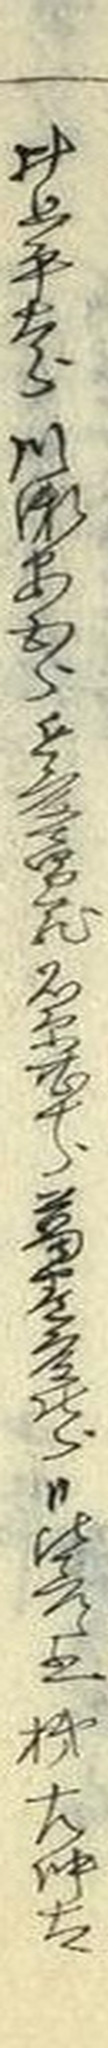井上平太郎川瀬安五郎近藤勇蔵石原甚十郎葛巻藤次郎日比彦之丞梯左仲太
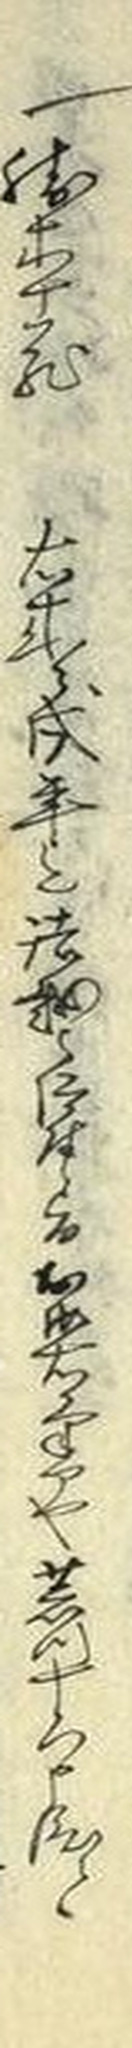勝木十蔵右来々戌年迄詰越被仰付候旨於御右筆部屋荒川十右衛門申渡候
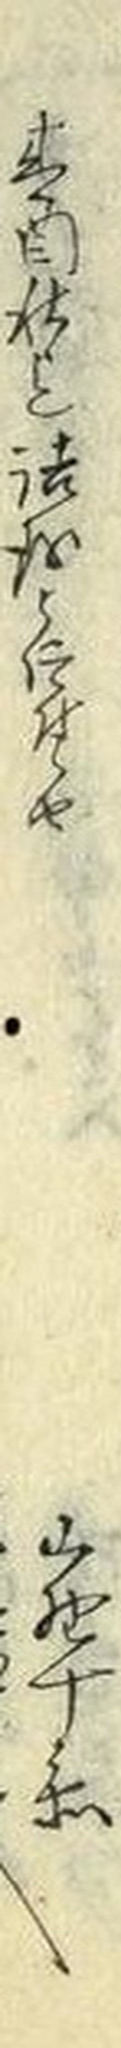来酉秋迄詰越被仰付候由山野十兵衛
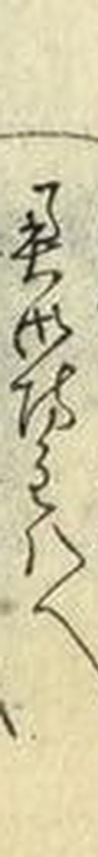奥御坊主八人
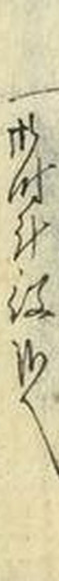時計役弐人
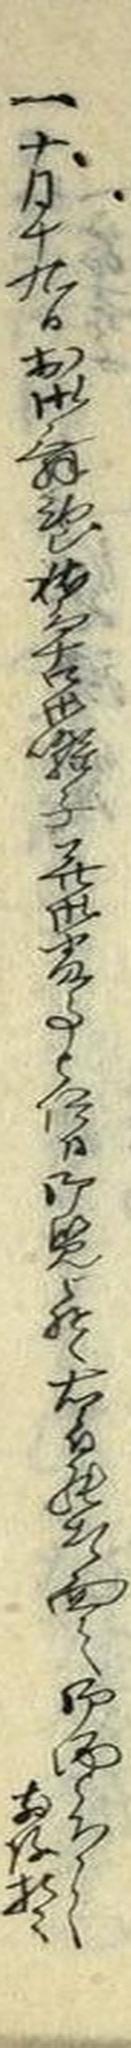一十月十九日於御舞台稽古御囃子幷御番事被仰付御覧被遊候右ニ付罷出候面々御酒被下之前後折々

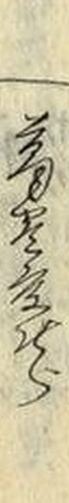葛巻藤次郎
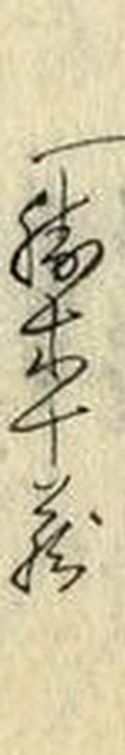勝木十蔵
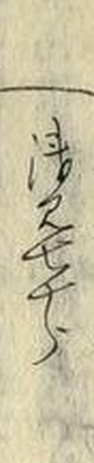浅見七十郎
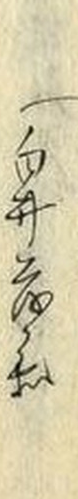白井茂兵衛
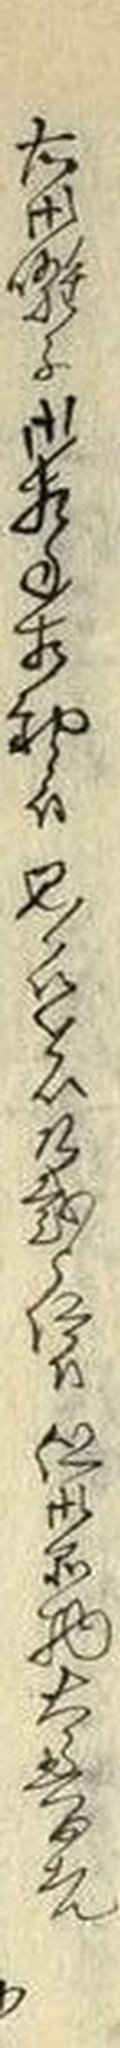右御囃子御相手相勤候ニ付思召を以頂戴被仰付但御品物大奥ゟ出ル
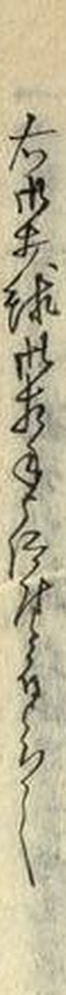右御打毬御相手被仰付候ニ付被下之
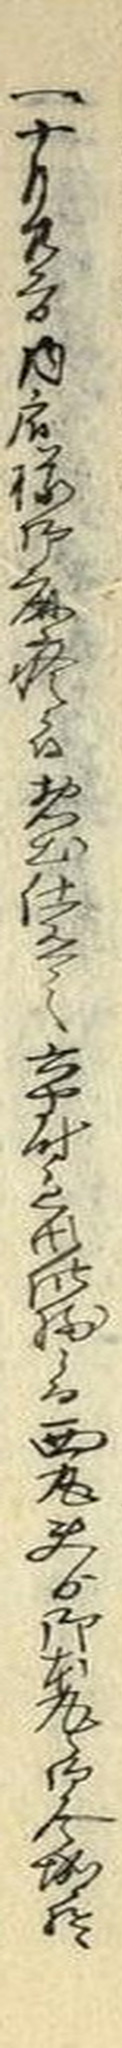一十月廿二日内府様御麻疹ニ付惣出仕有之六半時過御供揃ニ而西丸夫ゟ御本丸へ御登城被遊候
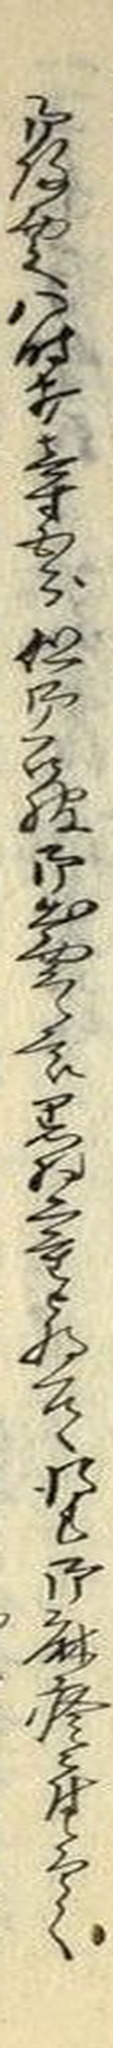御帰殿八時打壱寸五分但御召服御出殿之節黒羽二重被為召候得共麻疹ニ付候而之
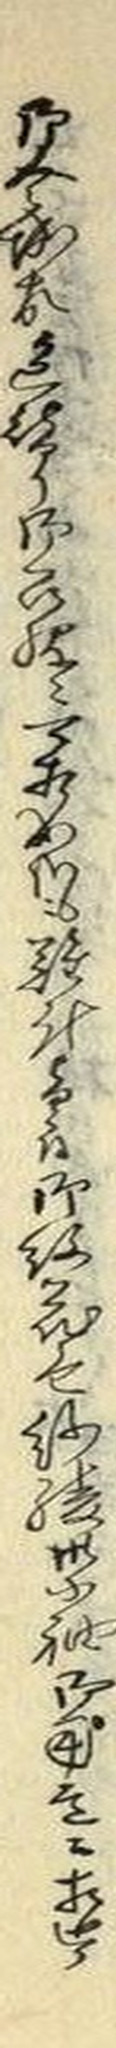御登城故追替り御召服ニ可相成哉も難計旨ニ付御紋花色紗綾御小袖御用意ニ
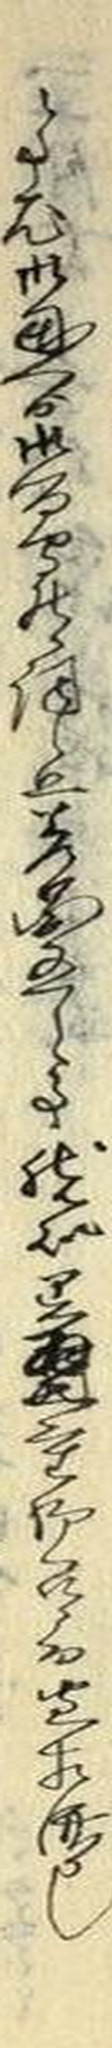相廻り候事尤御用人ゟ御留守居へ伺之上差図有之候事然ル処黒羽二重御召ニ而宜相済申候
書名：少傅日録抄（斉善付側向頭取日記、在府）
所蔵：福井県文書館 Fukui Prefectural Archives
